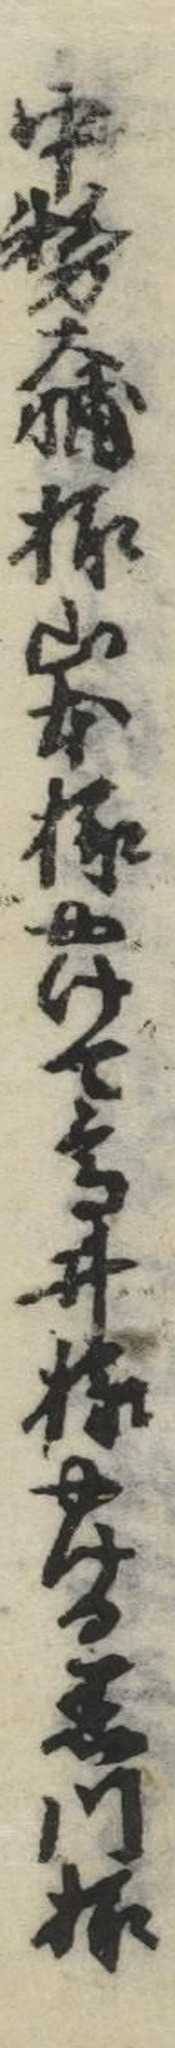中務大輔様山本様やけて高井様やける黒川様
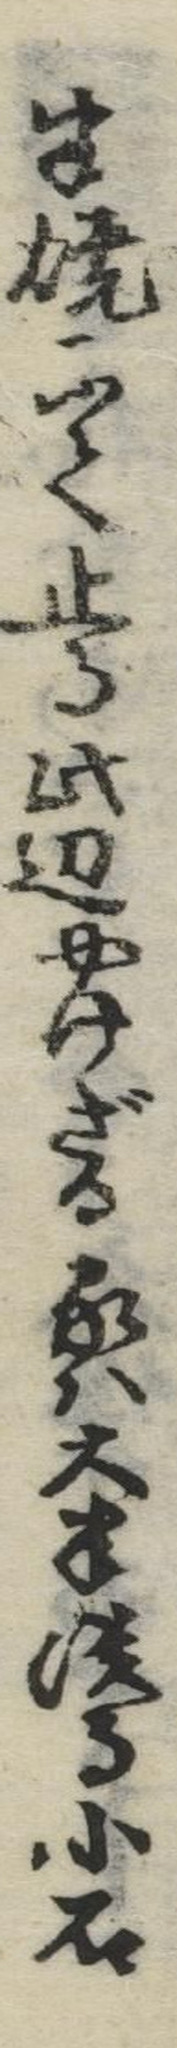半焼にて止る此辺やけざる家ハ大半潰る小石
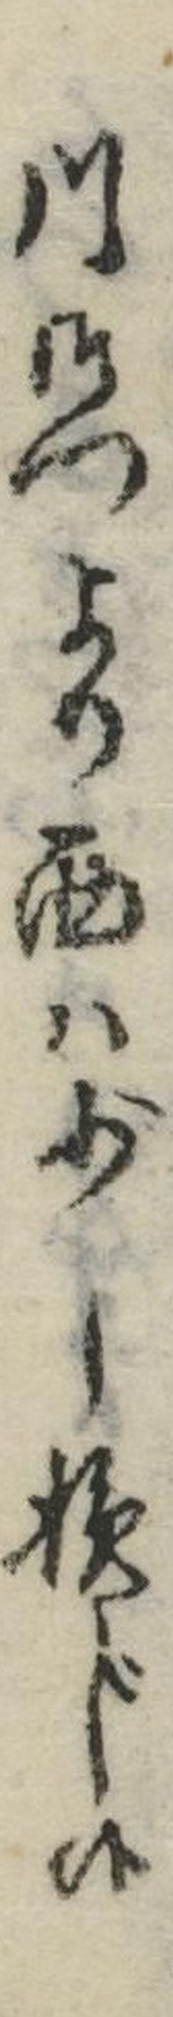川御門より西ハ少し損じ申候
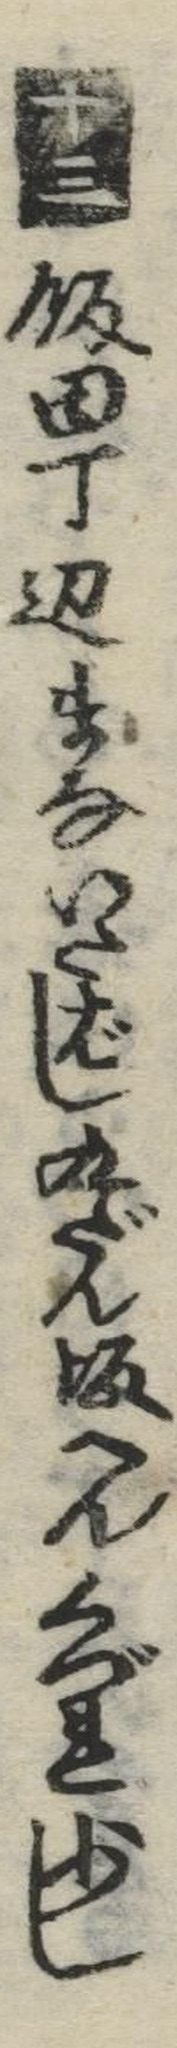十三飯田丁辺まないたばし九だん坂へんくづれ少し
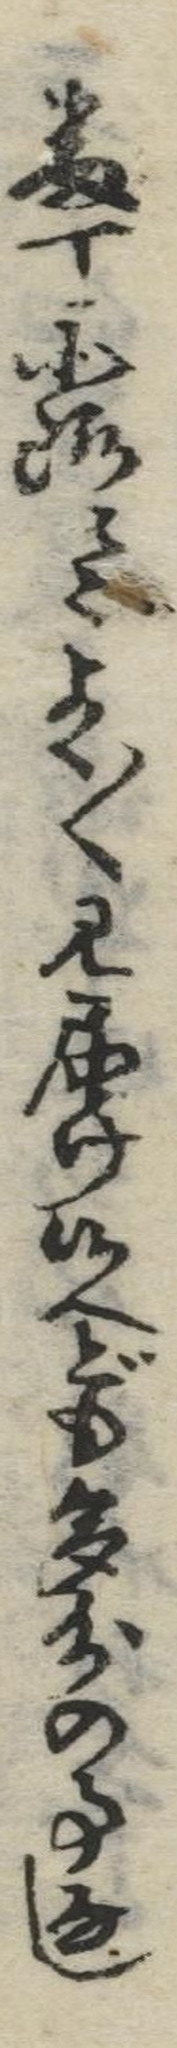番丁小路二ハよく〳〵見届け候へども多分の事なし
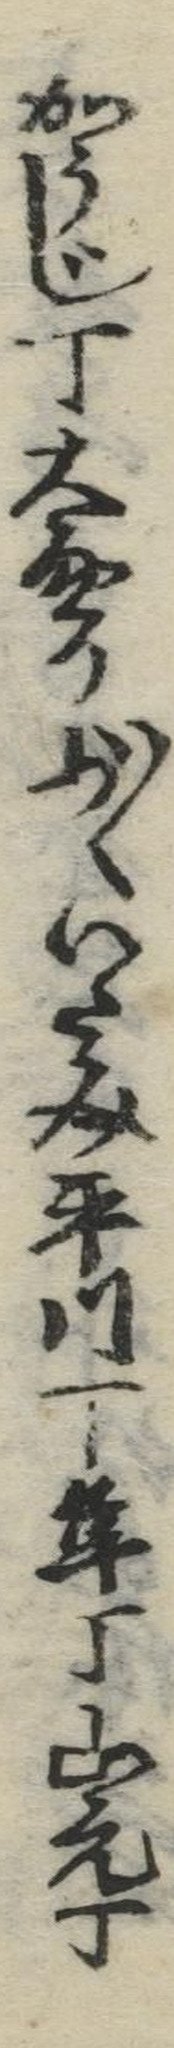かうじ丁大通り少々いたみ平川丁隼丁山元丁
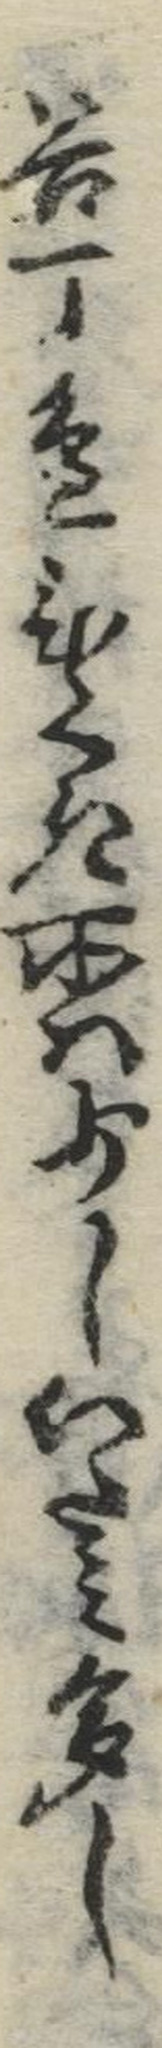谷丁辺ひくき所ハ少しいたミ多し
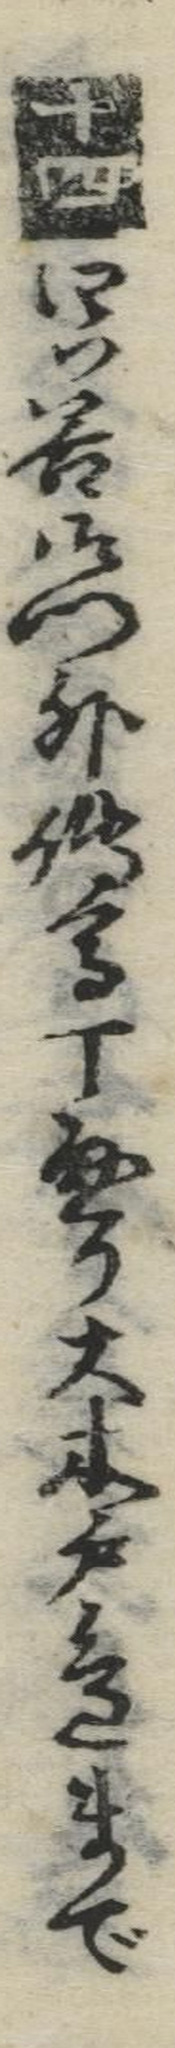十四四ッ谷御門外伝馬丁通り大木戸辺まで
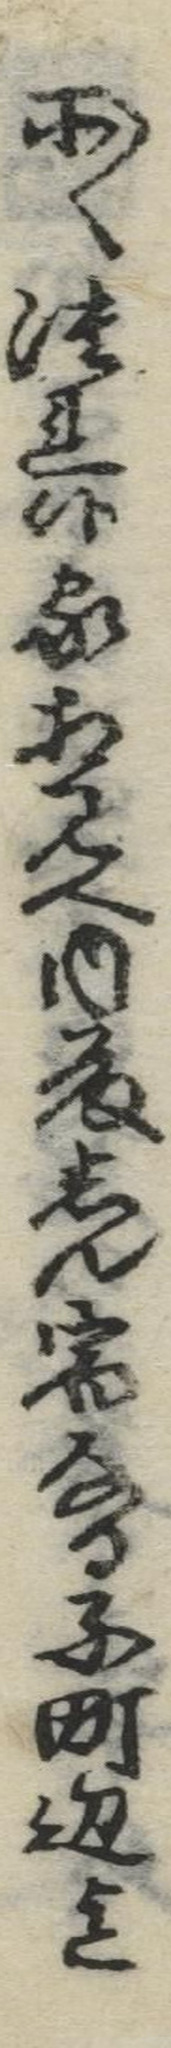所々潰れ候家相見へ内藤しん宿なる子町辺迄
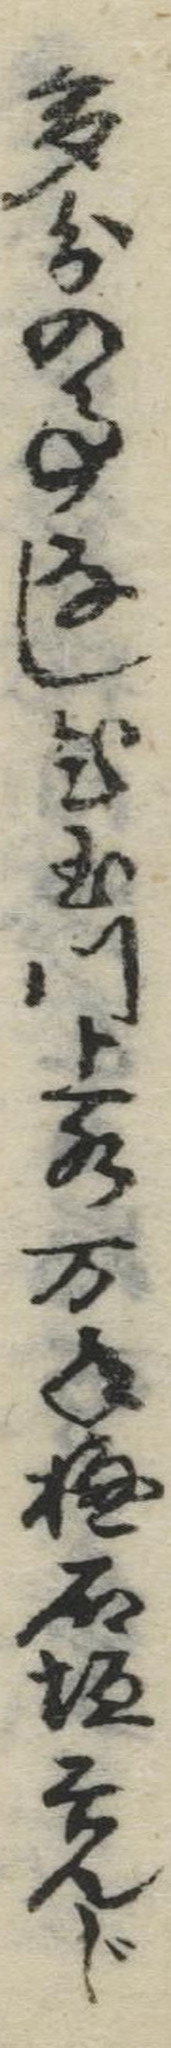多分の事なし尤玉川上水万年樋石垣そんじ
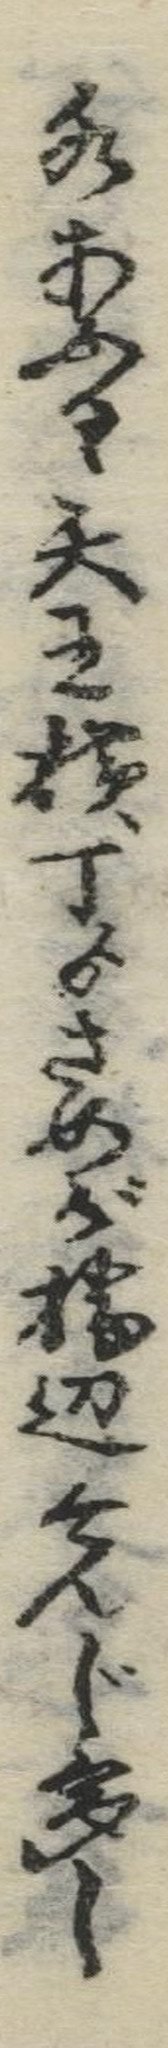水あふるゝ天王横丁ゟさめが橋辺そんじ多し
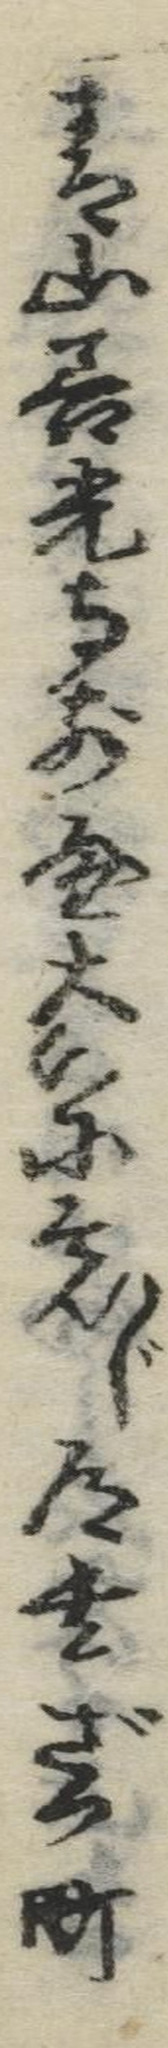青山善光寺前通大いにそんじ道玄ざか町
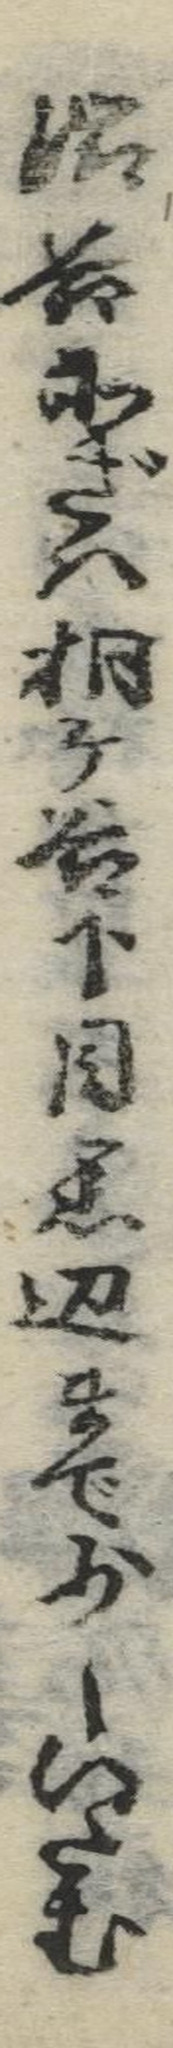渋谷小ざハ相ヶ谷下目黒辺まで少しいたむ
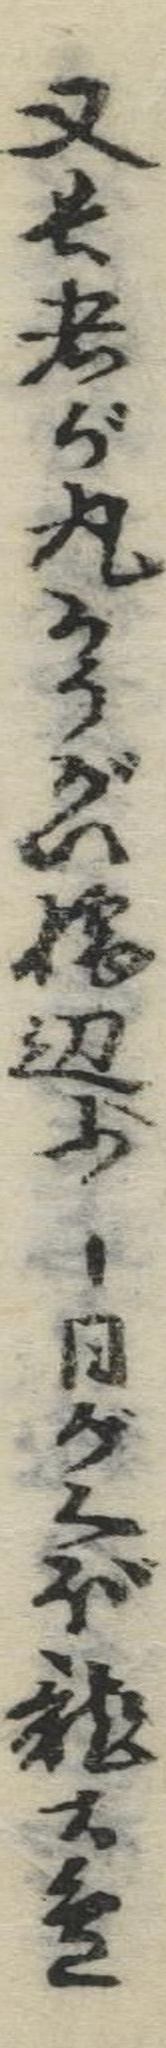又長者が丸かうがい橋辺少し日がくぼ龍土辺
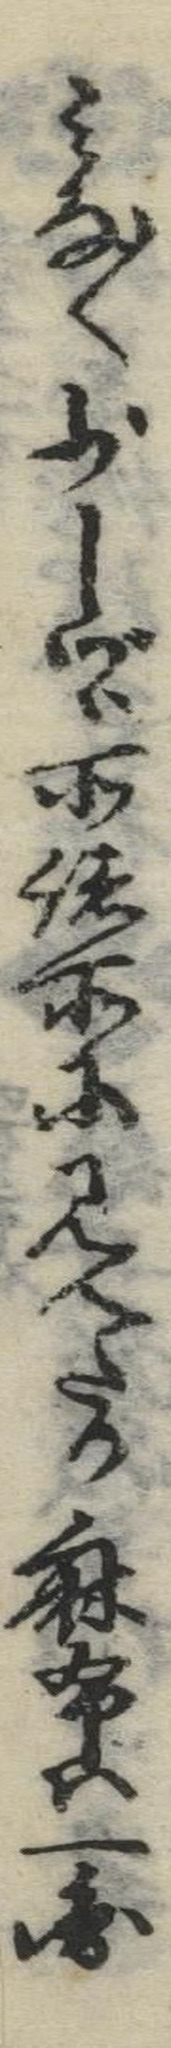ミな〳〵少しヅゝ所諸所に見へたり麻布ハ一円
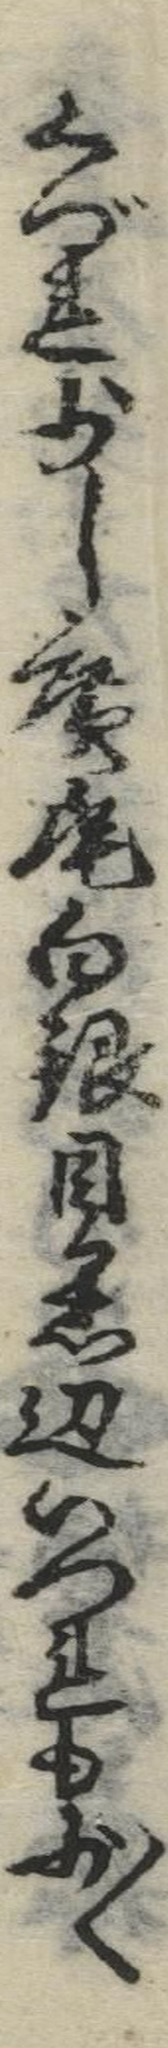くづれ少し広尾白銀目黒辺いつれも少々
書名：安政二卯十月二日夜四ツ時過　御府内御屋敷方市中共　地震類焼場所明細書之寫　并街道筋近郷聞書
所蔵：東京大学地震研究所図書室 Earthquake Research Institute Library, The University of Tokyo, JAPAN
